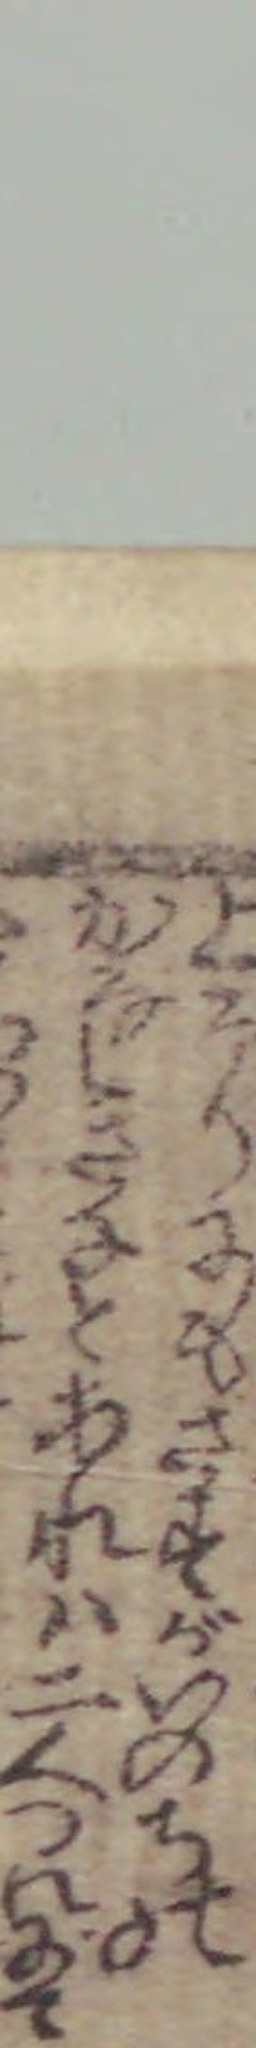かなしさにとあれは二人つれにて
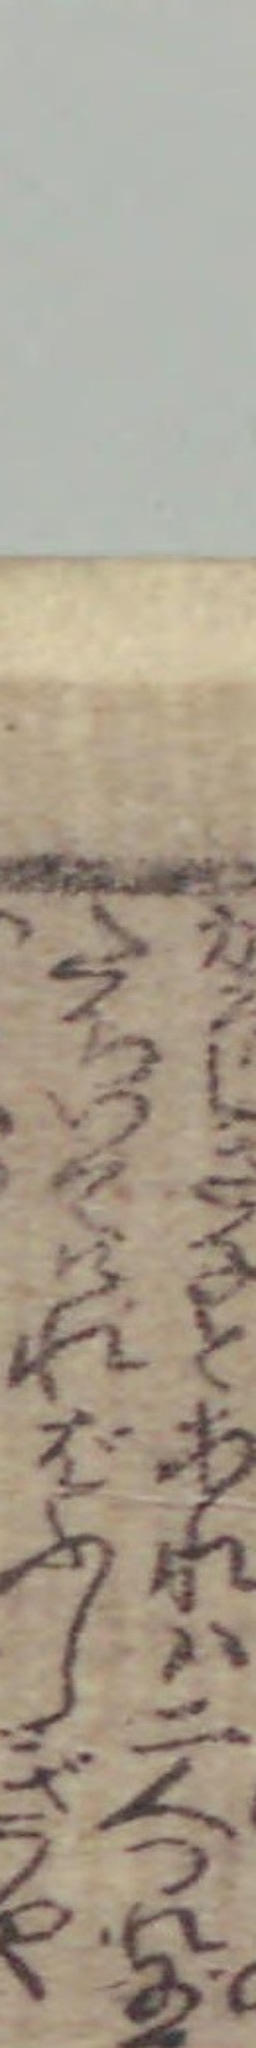たちいてければふしぎや
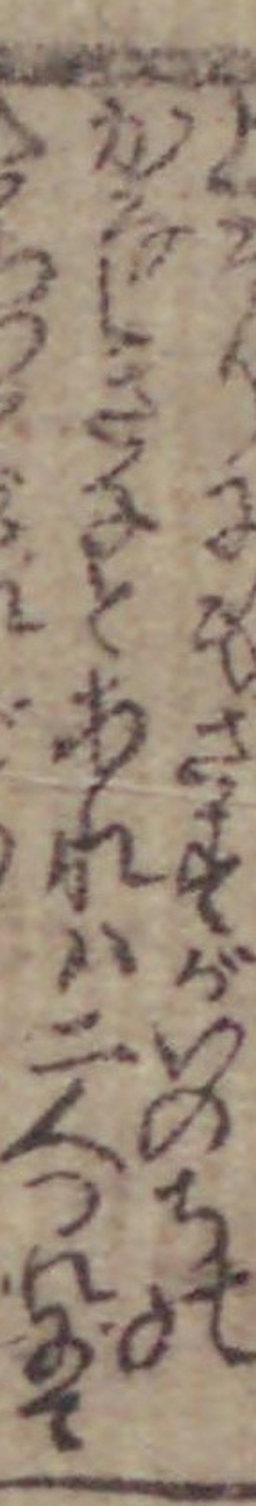かなしさにとあれは二人つれにて
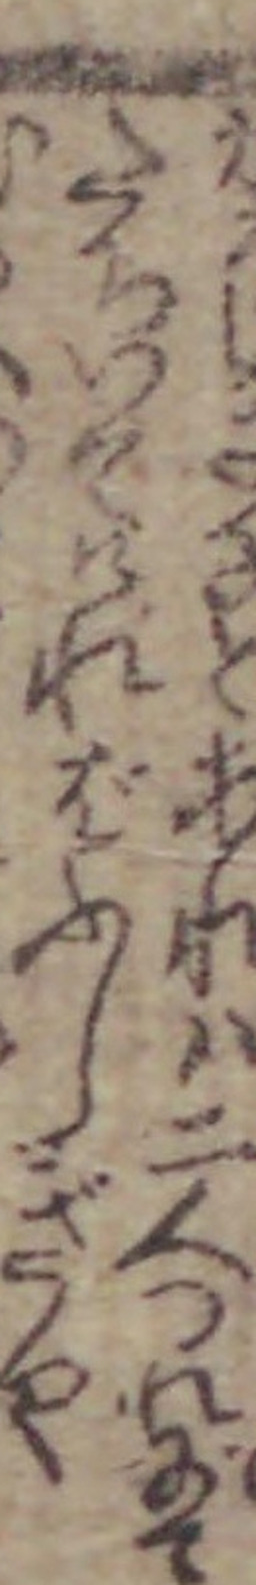たちいてければふしぎや
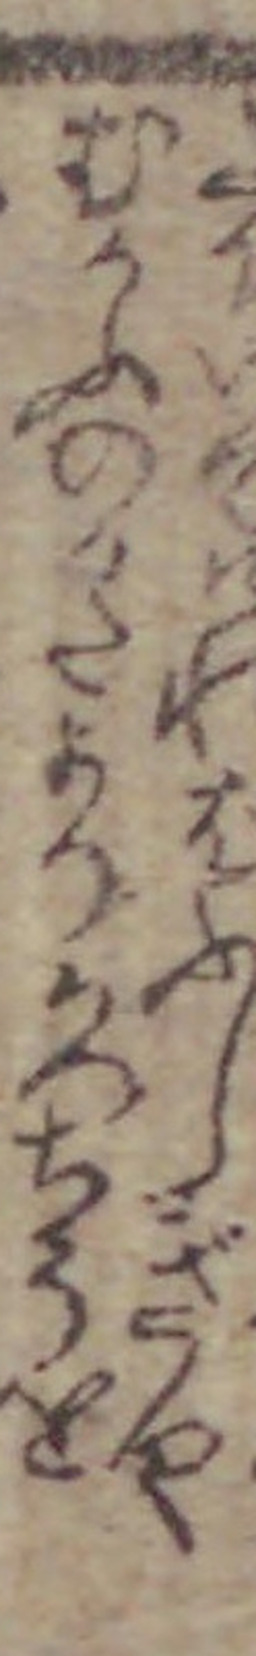むかふのかたよりかつちうを
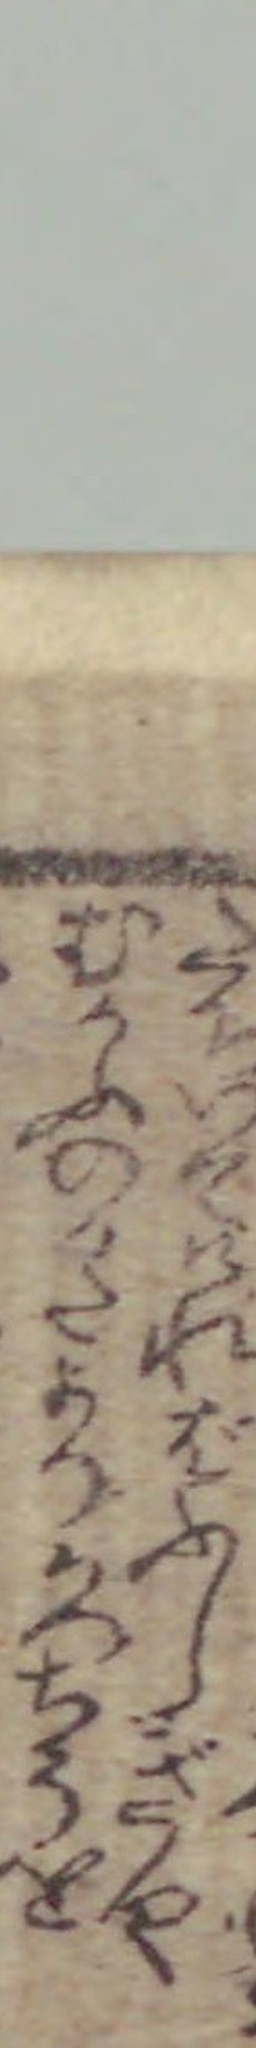むかふのかたよりかつちうを
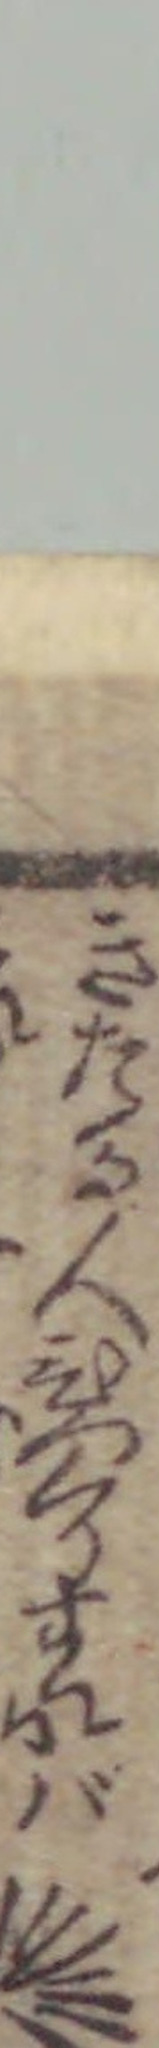きたる人ひつくりすれば
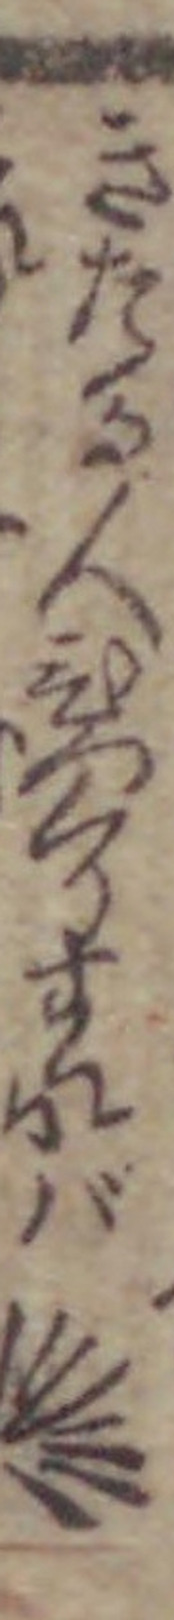きたる人ひつくりすれば
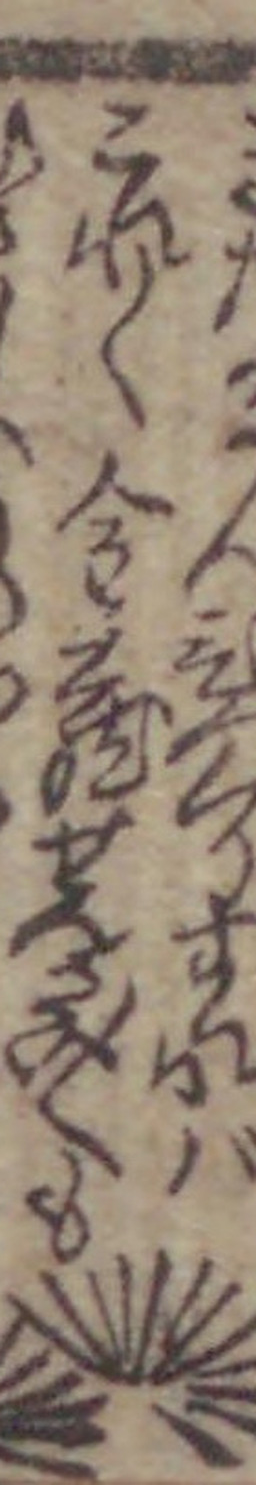これ〳〵金蔵せんさい〳〵も
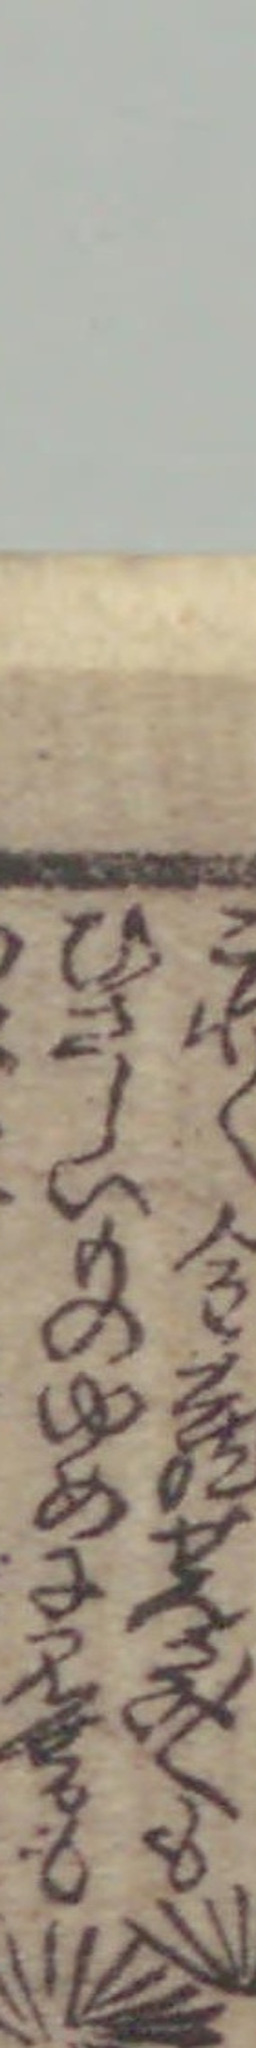ひさしいものゆめに見せるも
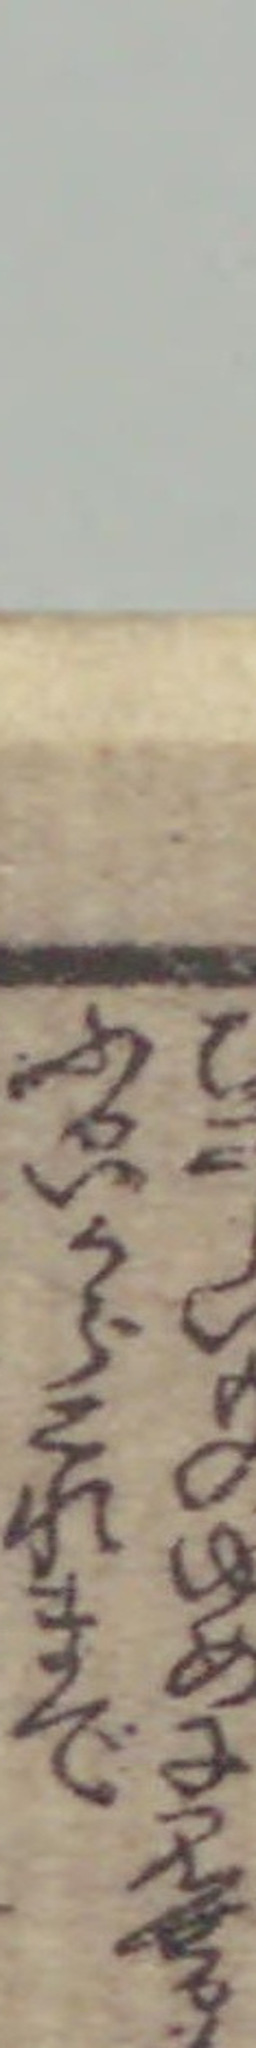ふるいからこれまで
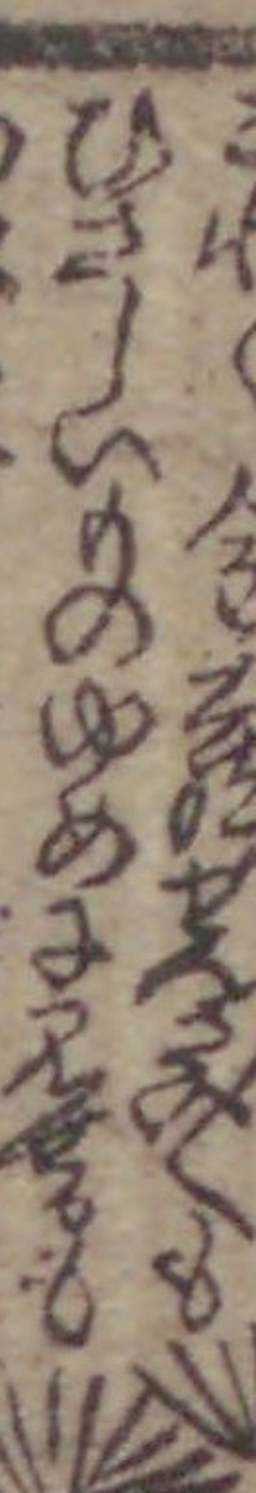ひさしいものゆめに見せるも
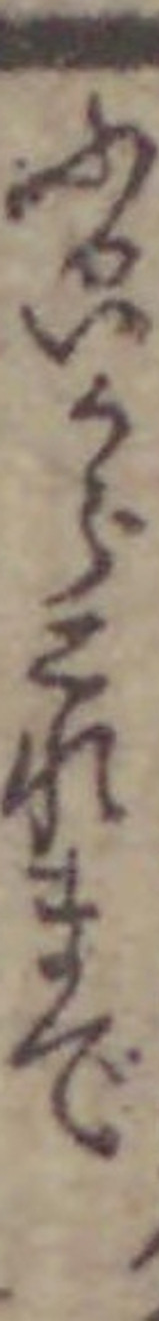ふるいからこれまで
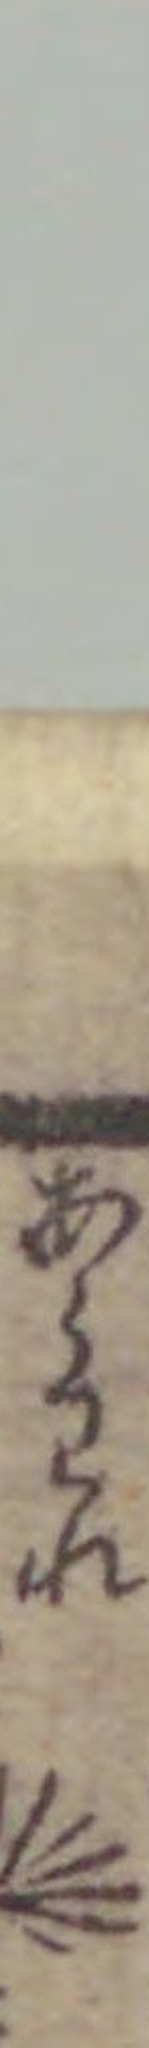あらわれ
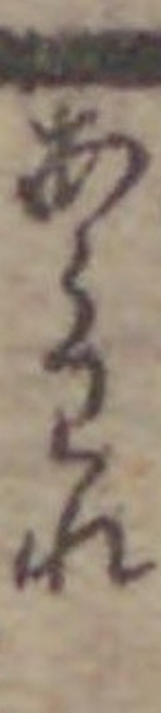あらわれ
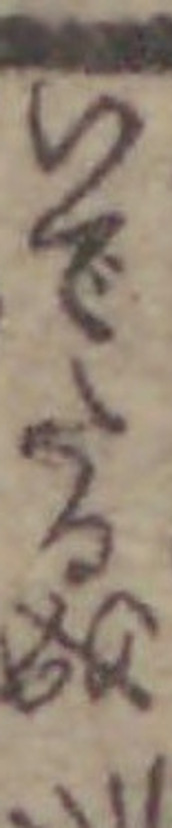いでたる成
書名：御代の御寶
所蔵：国立国会図書館 National Diet Library, JAPAN
